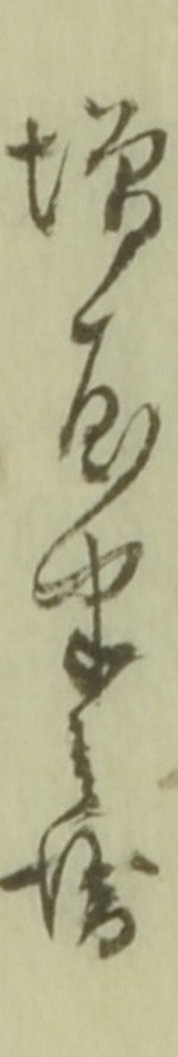布屋籐兵衛
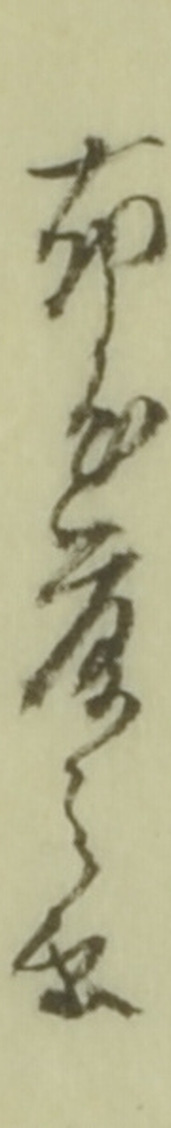布屋籐兵衛
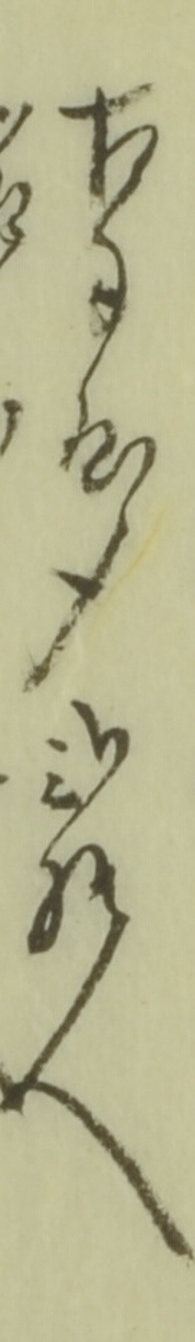古手屋〆弐拾人
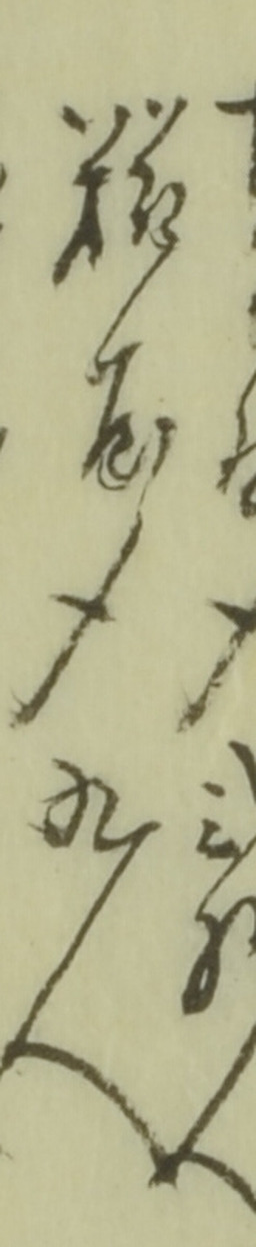糀屋〆九人
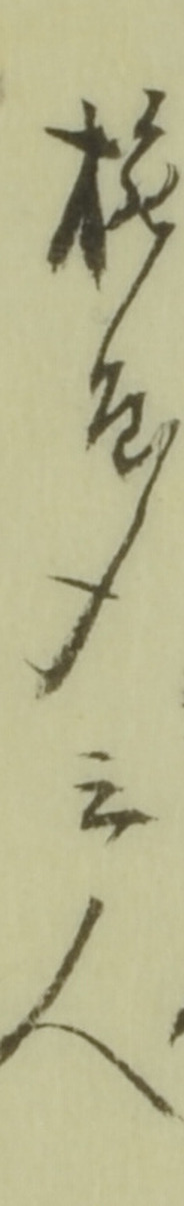糀屋〆九人
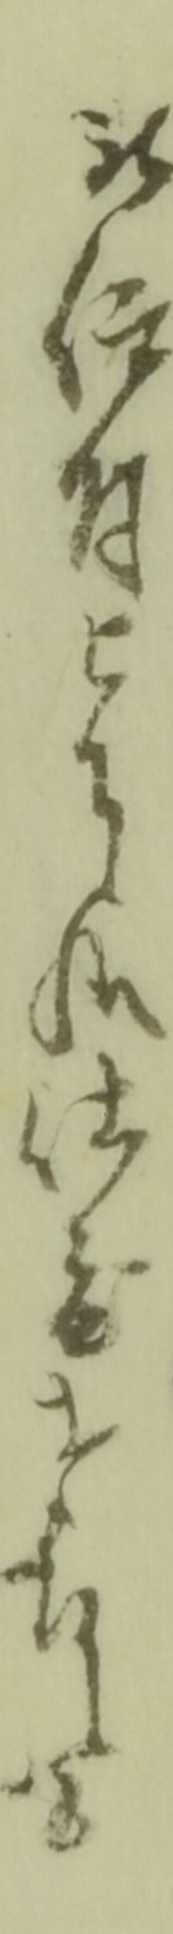被仰付被下候様仕度被得候以上
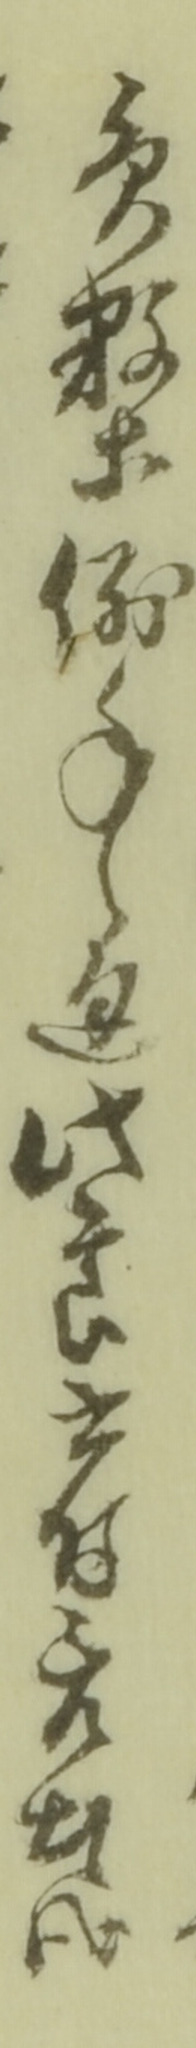員数等例年之通此節書付差出候様
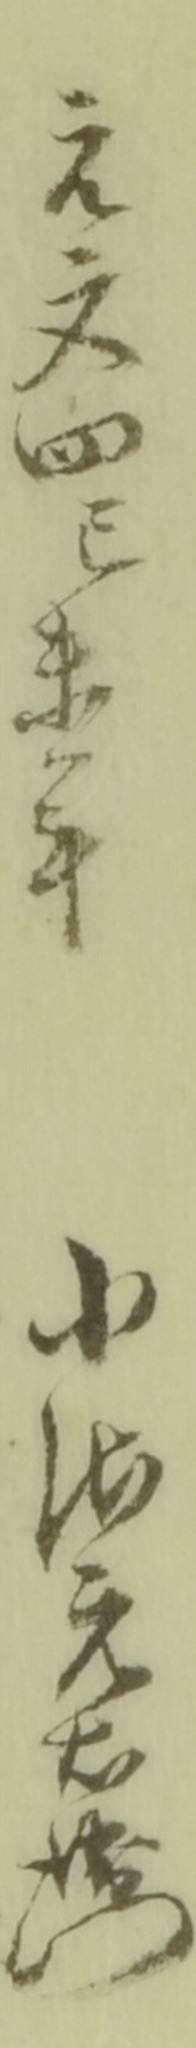元文四巳未年小堀元右衛門

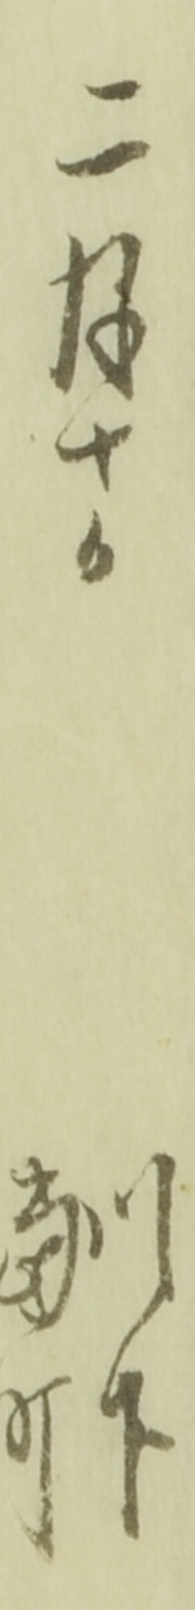二月十日川下
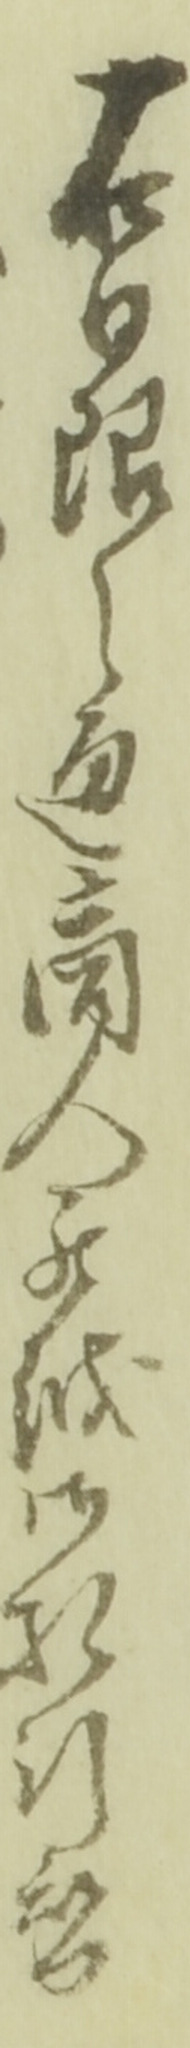右日限之通商人罷越御松引替
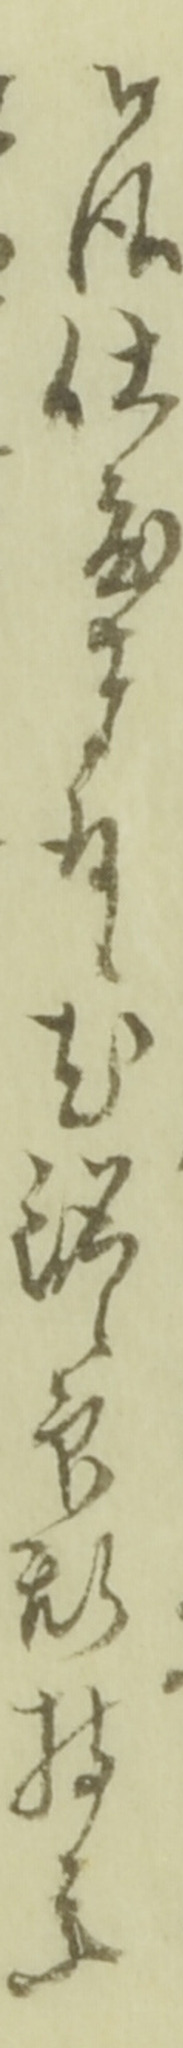候様仕度奉存候尤証之印形持参
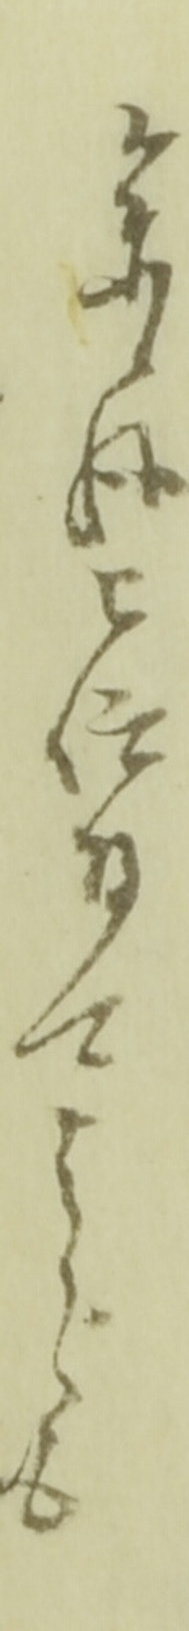参候様被仰付可申候以上
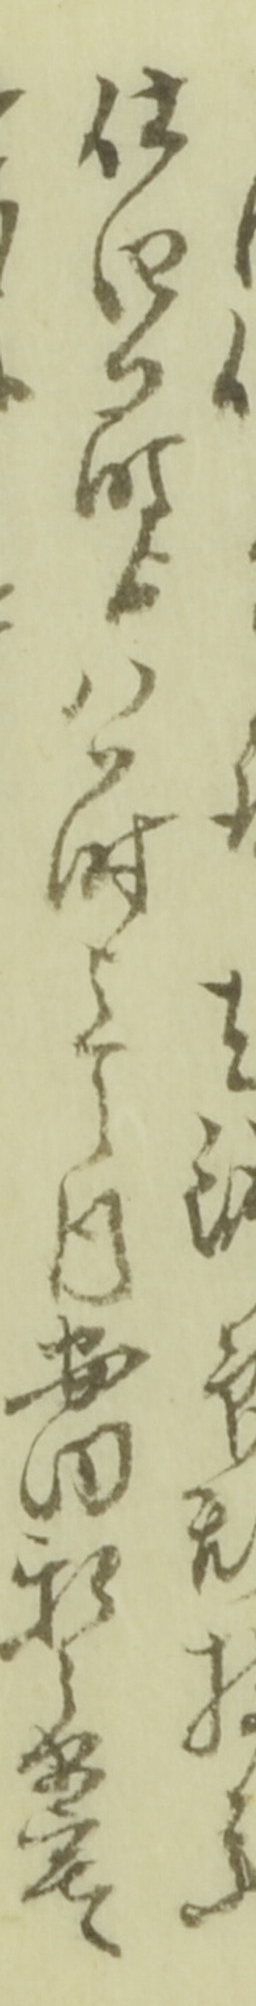仕四日町より八ツ時迄之内安田新之丞宅へ
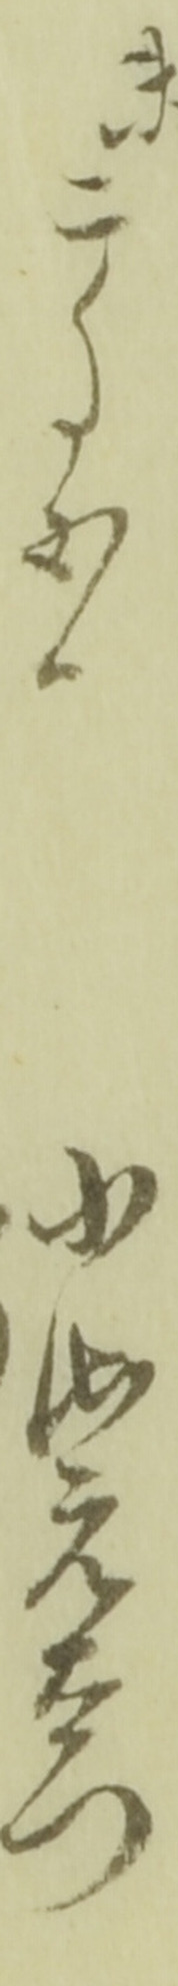未二月五日小堀元右衛門
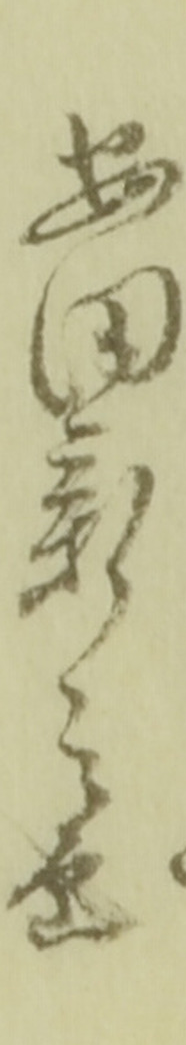安田新之丞
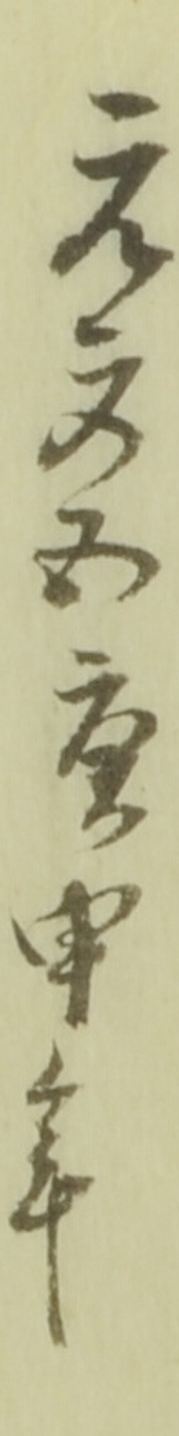元文五寅申年
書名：御公儀様御領主様御触書控
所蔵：伊那市立高遠町図書館・合同会社AMANE
